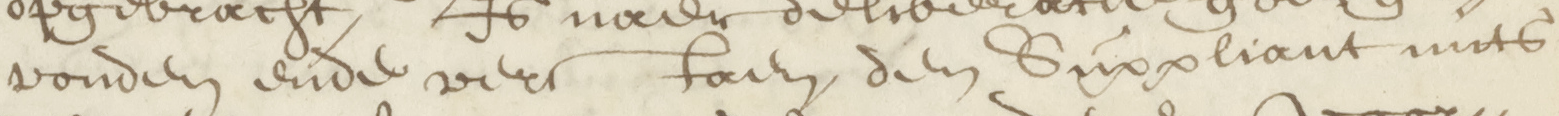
vonden ende verstaen, den Suppliant mits
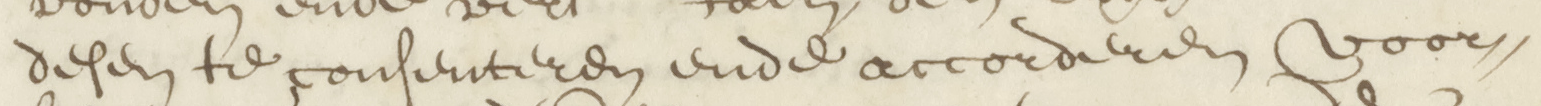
desen te consenteren ende accorderen voor„
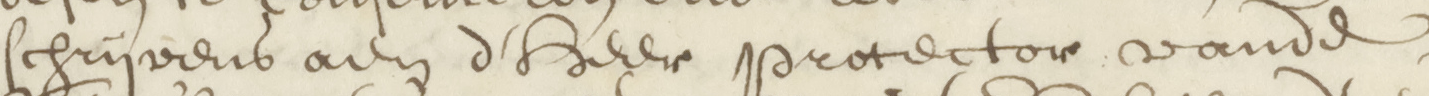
schrijvens aen d'Heer protector vande
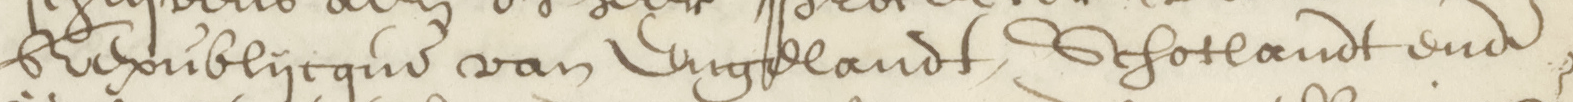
Republijcque van Engelandt, Schotlandt ende
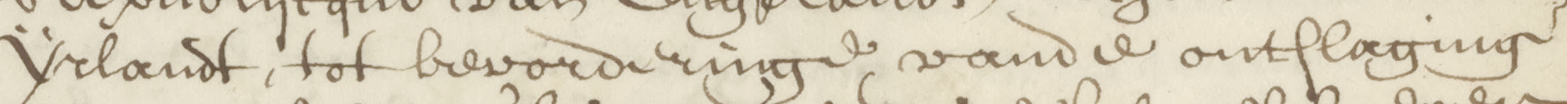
Yrlandt, tot bevorderinge vande ontslaginge
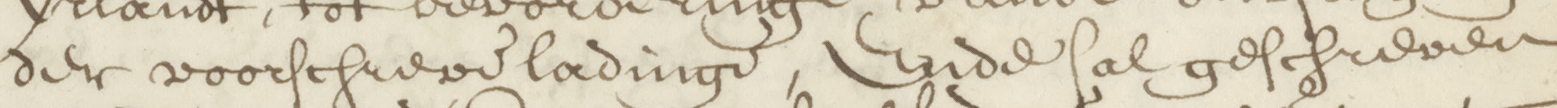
der voorschreve ladinge. Ende sal geschreven
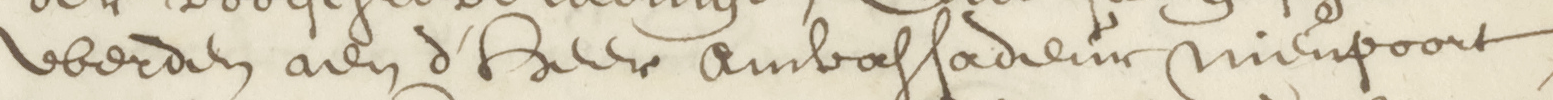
werden aen d'Heer Ambassadeur Nieupoort
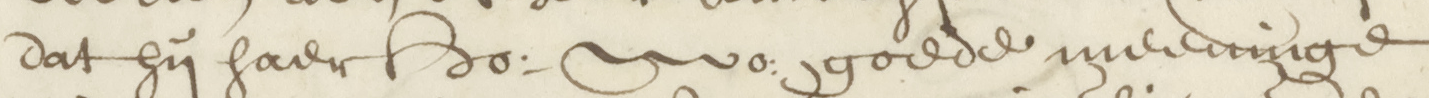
dat hij haer Ho:Mo: goede meeninge
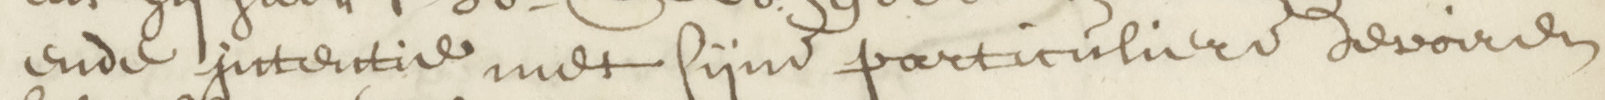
ende intentie met sijne particuliere devoiren
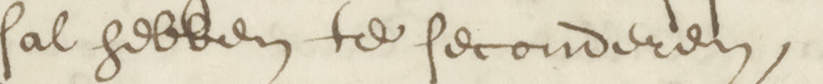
sal hebben te seconderen.
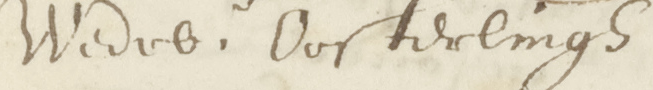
Wedwe. Oosterlingh
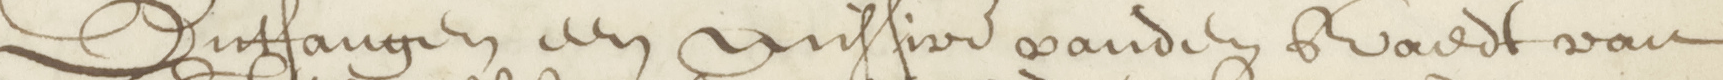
Ontfangen een Missive vanden Raedt van
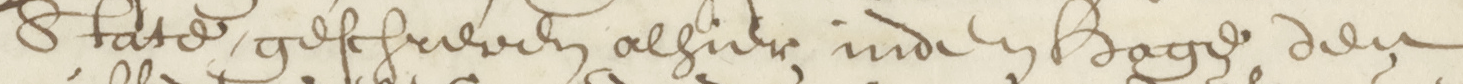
State, geschreven alhier inden Hage den
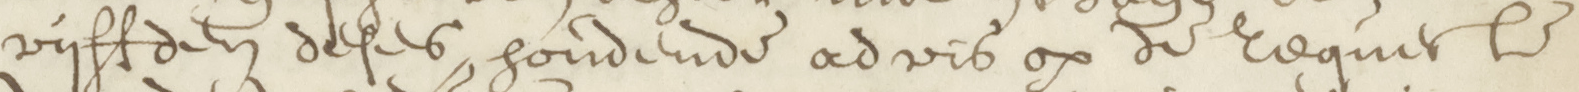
vijffden deses, houdende advis op de requeste
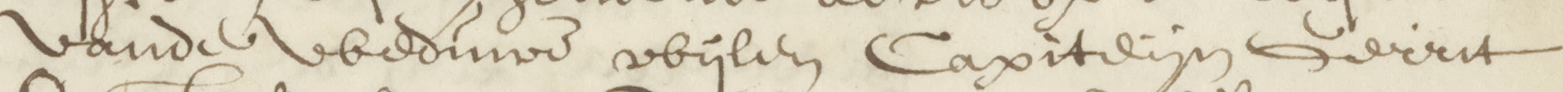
vande weduwe wijlen Capiteijn Gerrit
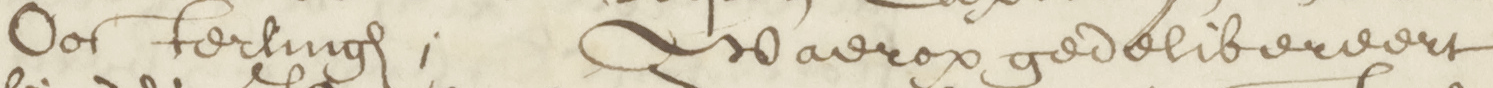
Oosterlingh: Waerop gedelibereert
